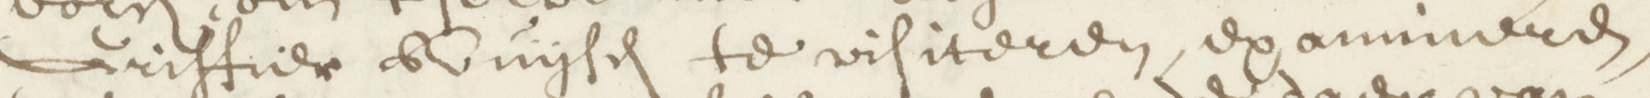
Griffier Ruijsch te visiteren, examineren,
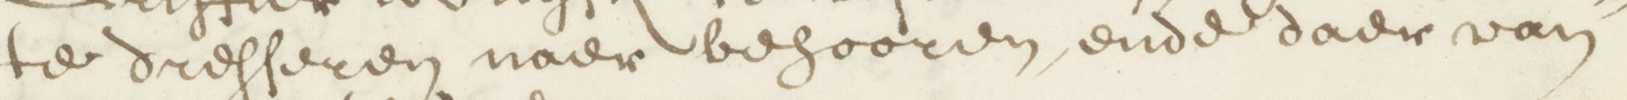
te dresseren naer behooren ende daer van
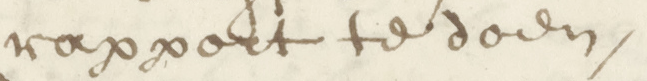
rapport te doen.
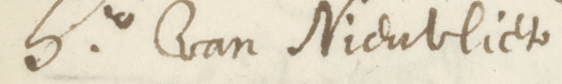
Hr. van Nieuvliet
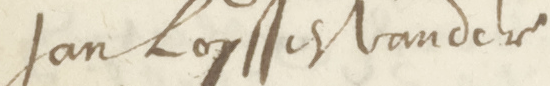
Jan Loyssen van der
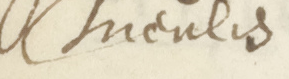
Meulen
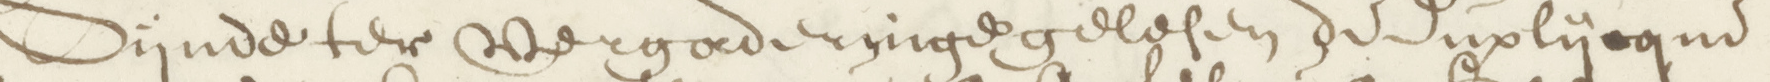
Sijnde ter vergaderinge gelesen de duplijcque
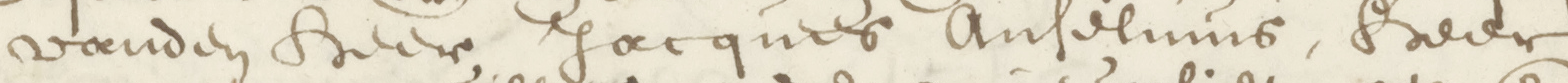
vanden heer Jacques Anselmus, heer
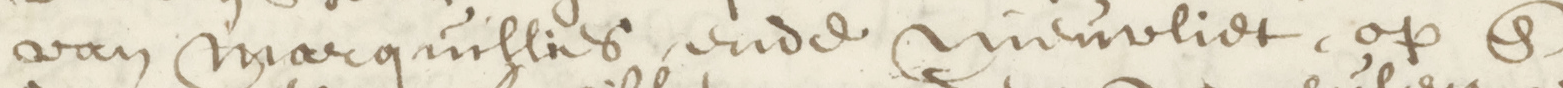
van Marquillies, ende Nieuvliet, op &
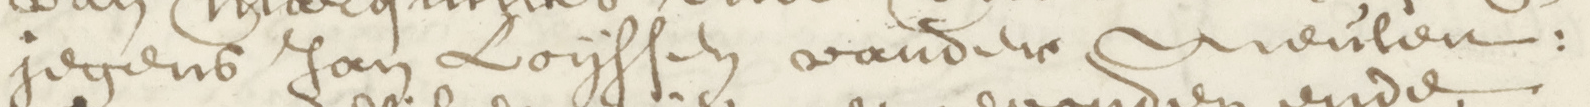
jegens Jan Loijssen van der Meulen:
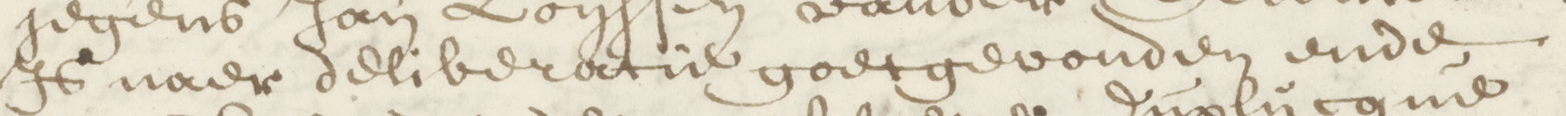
Is naer deliberatie goetgevonden ende
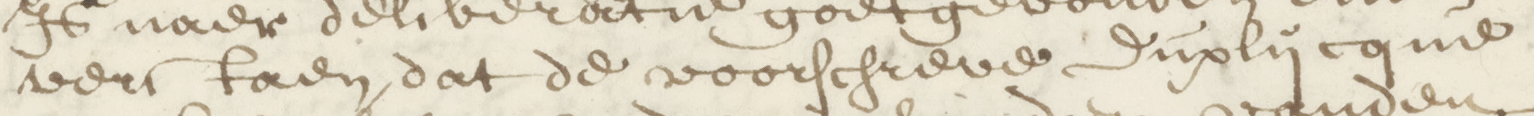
verstaen, dat de voorschreve duplijcque
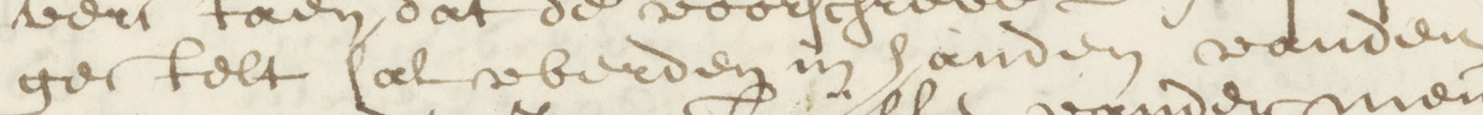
gestelt sal werden in handen vanden
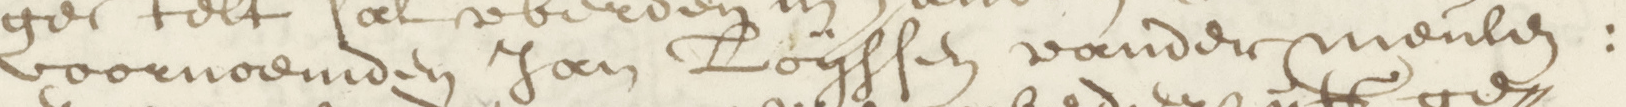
voornoemden Jan Loijssen van der Meulen:
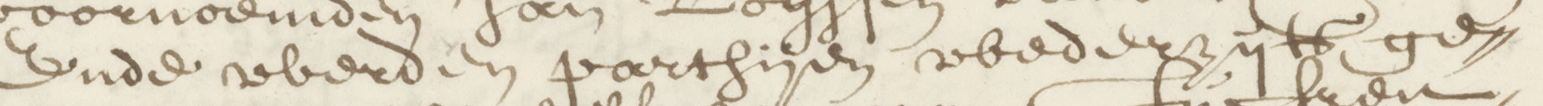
Ende werden parthijen wederzijts ge„
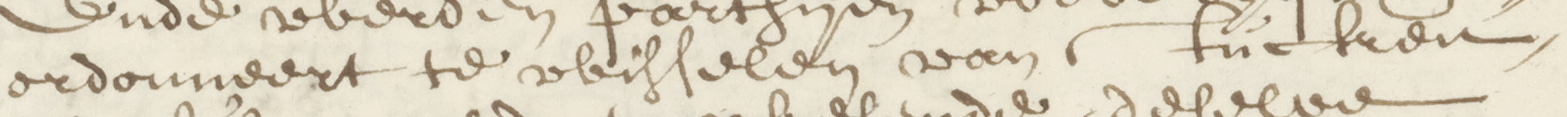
ordonneert te wisselen van stucken
